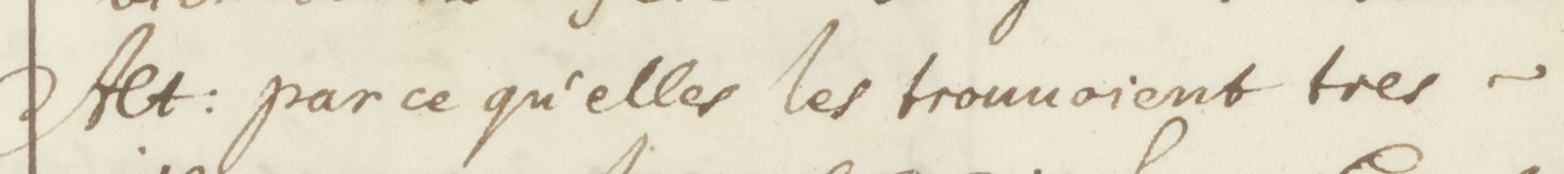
Alt: parce qu'elles les trouvoient tres
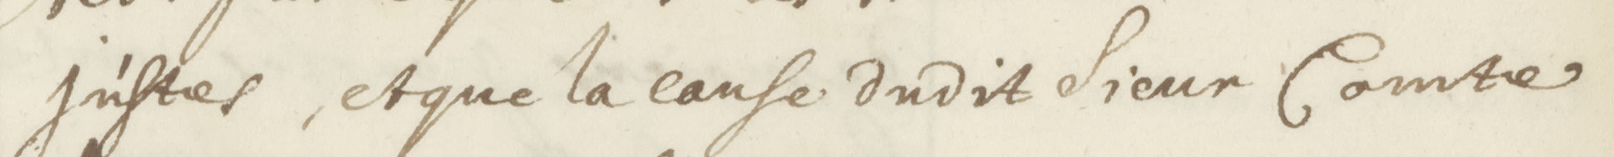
justes, et que la cause dudit Sieur Comte
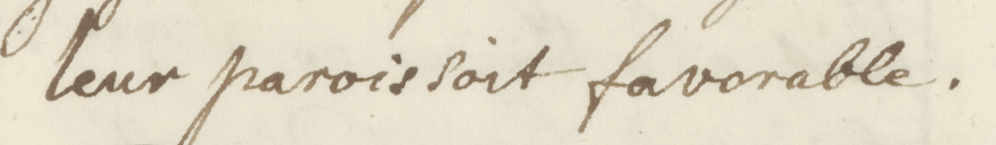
leur paroissoit favorable.
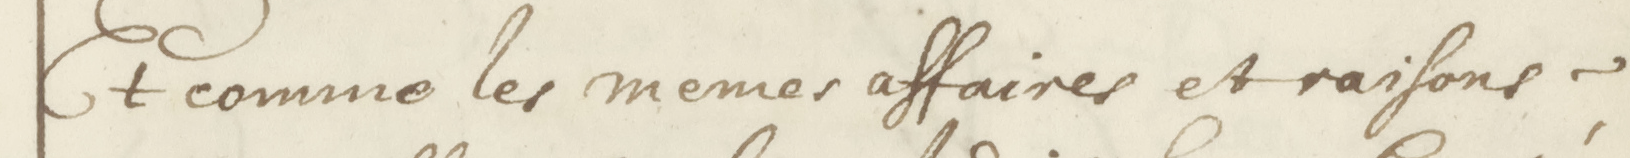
Et comme le memes affaires et raisons
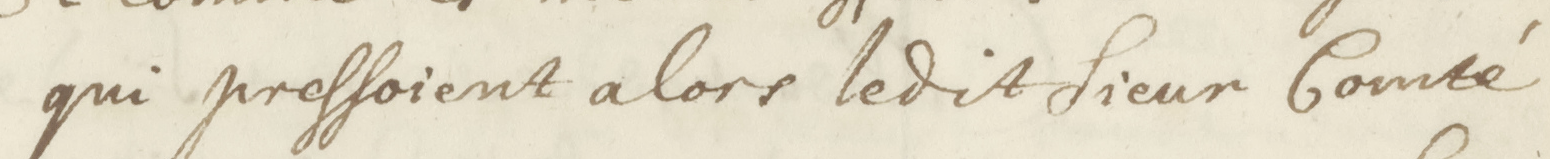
qui pressoient alors ledit Sieur Comté
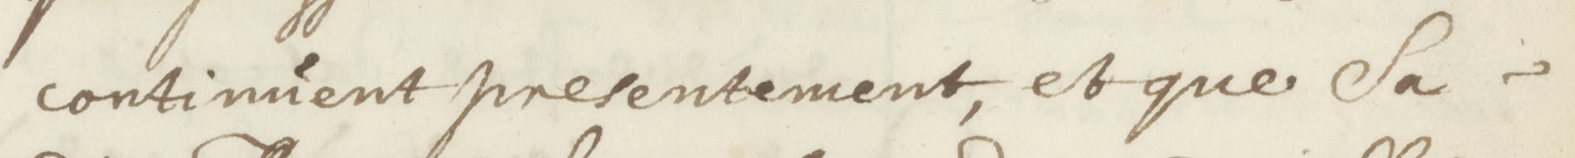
continuent presentement, et que Sa„
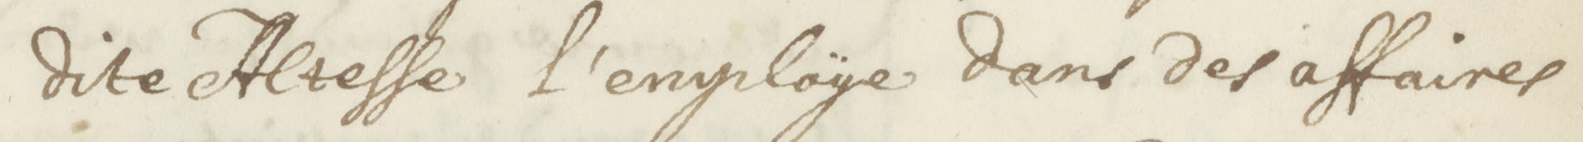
dite Altesse, L'emploijé dans des affaires
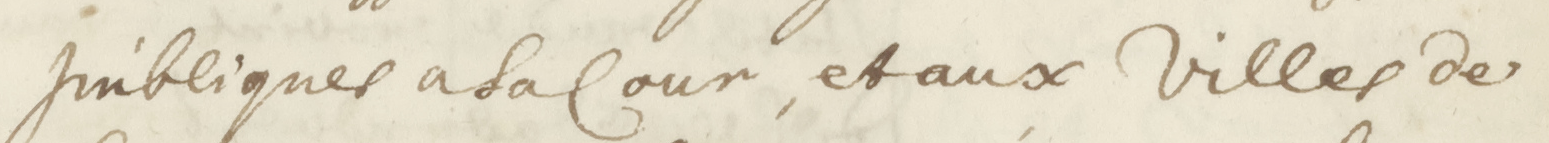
publiques a sa Cour, et aux Villes de
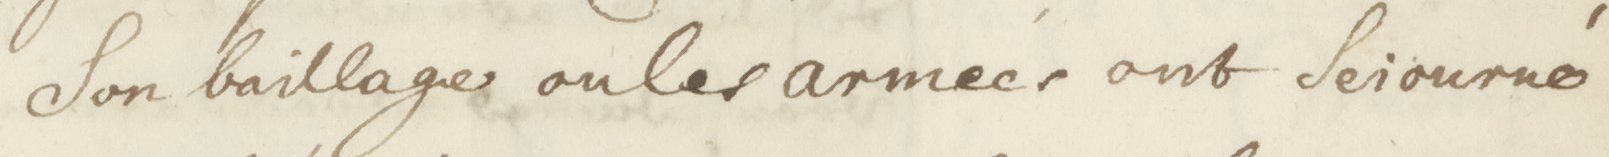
son baillage ou les armees, ont seiourné
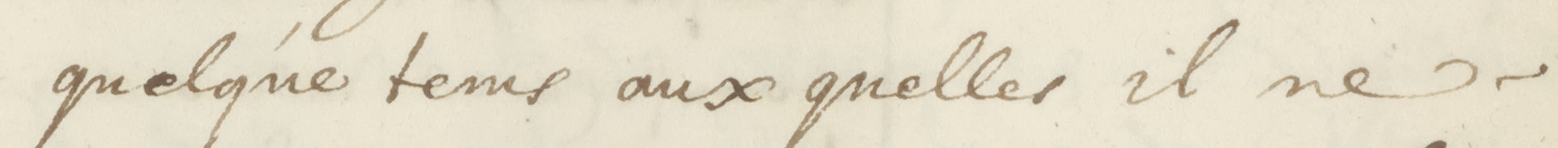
quelque tems aux quelles il ne
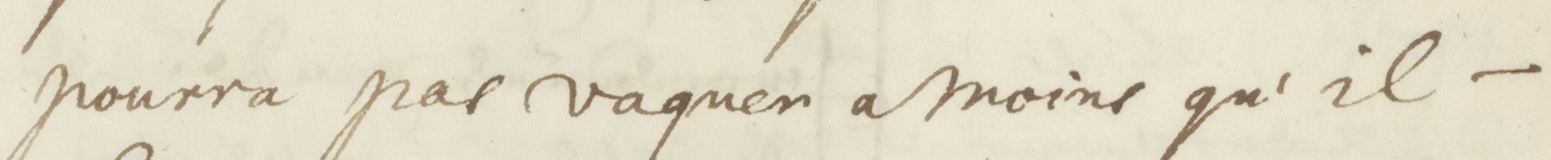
pourra pas vaquer a moins qu'il -
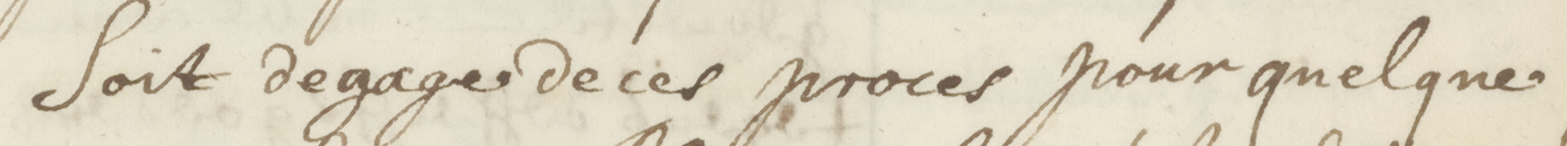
Soit degage de ces proces pour quelque
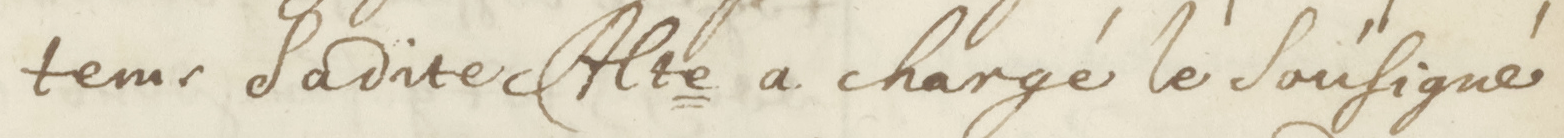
tems sadite Alte a chargé le sousigné
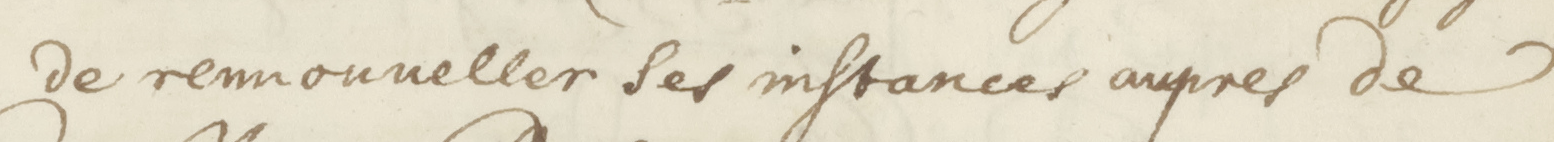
de rennouveller ses instances aupres de
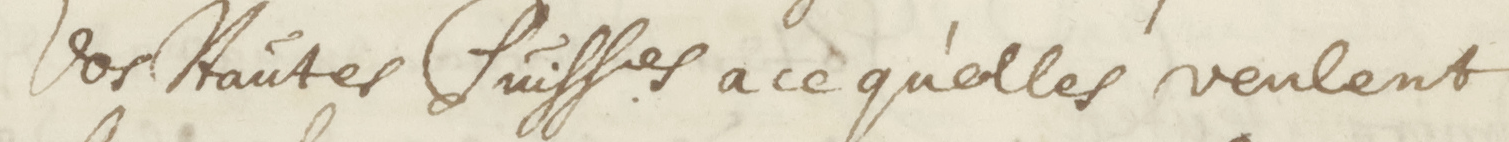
Vos Hautes Puisses a ce qu'elles veulent
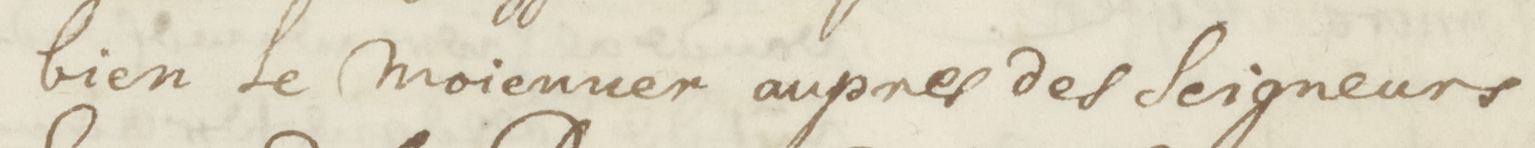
bien le moienner aupres des Seigneurs
